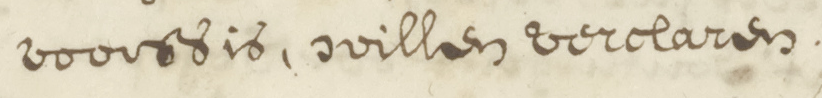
voorsz is, willen verclaren.
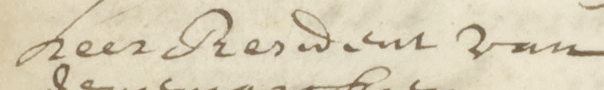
heer Resident van
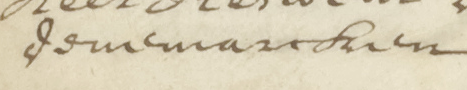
denemarcken
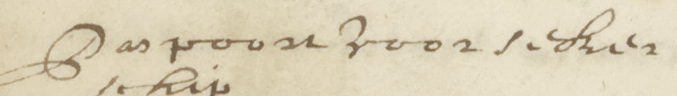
Paspoort voor seker
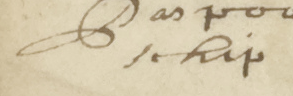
schip
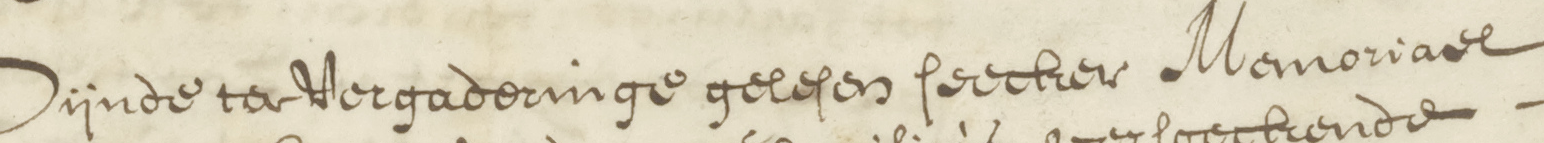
Sijnde ter Vergaderinge gelesen seecker Memoriael
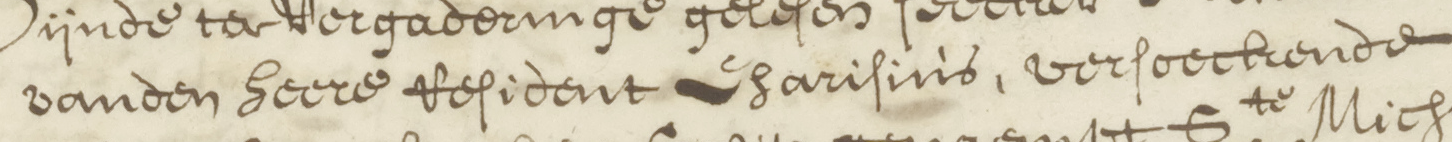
vanden heere Resident Charisius, versoeckende
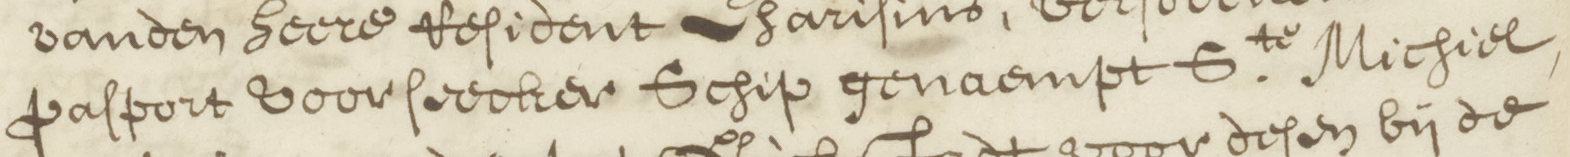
pasport voor seecker Schip genaempt Ste. Michiel,
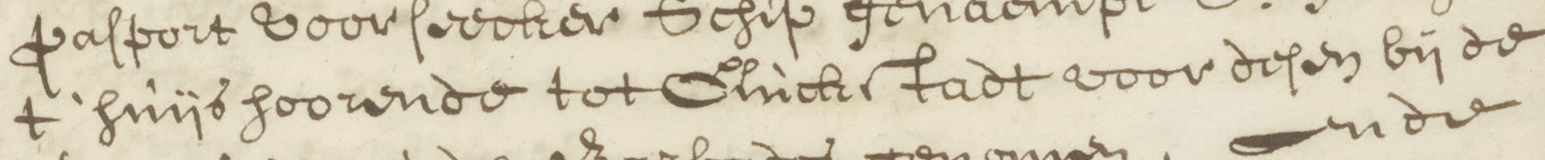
t'huijshoorende tot Gluckstadt voor desen bij de
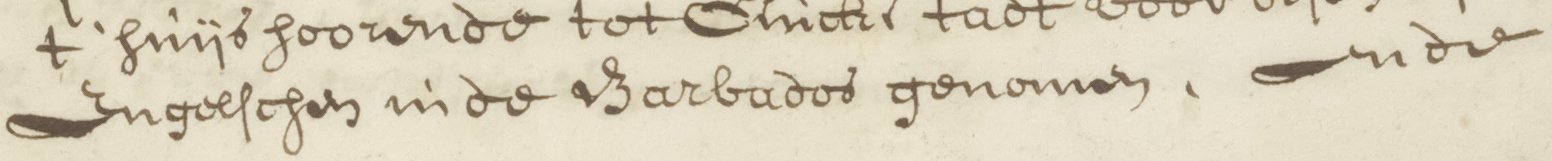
Engelschen in de Barbados genomen. Ende
